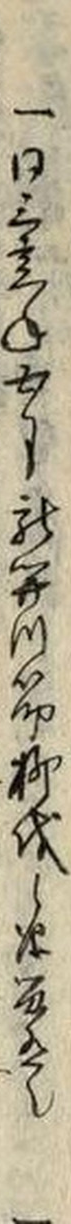一同三亥年五月新開川筋柳伐之儀留有之
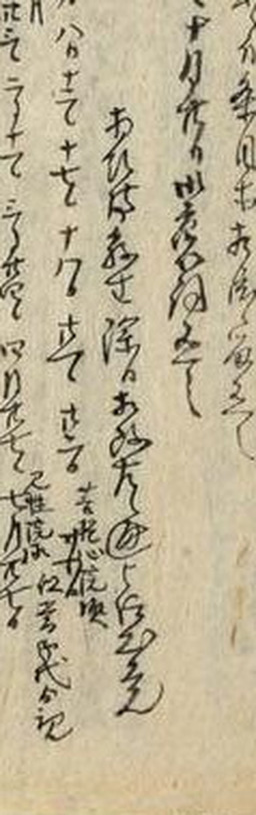一拝領場殺生除日相改左之通被仰出覚
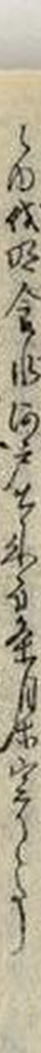之内伐明含水河戸出来ニ付条目等定り候事
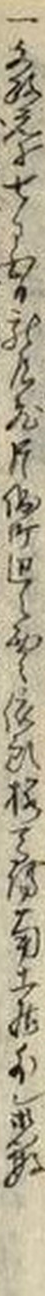一文政元寅七月五日新屋敷片側町辺之面々依願桜馬場南土居外レ御薮
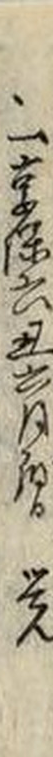・一享保六丑六月朔日覚
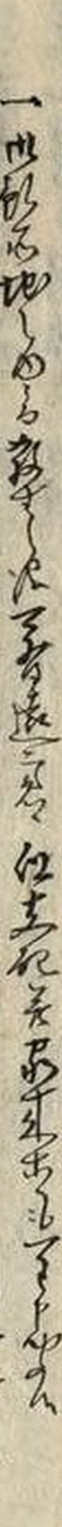一御預所地之内ニ而薮生之儀可有遠慮候但支配幷家来等へも可被申聞候
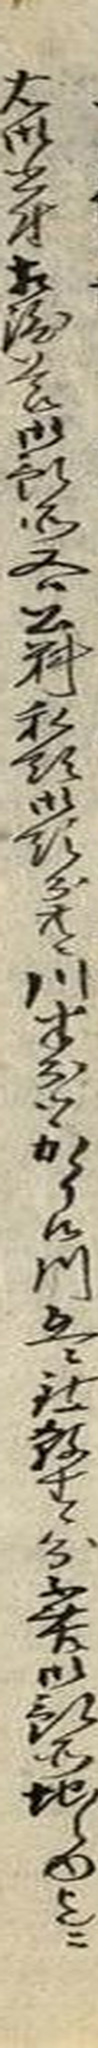右御書付相渡節御預所又ハ公料私領御領分共ニ川半分ツヽかゝり候川互ニ致殺生候分不苦御預所地之内迄ニ
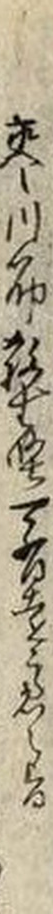交候川筋殺生堅可有遠慮候旨
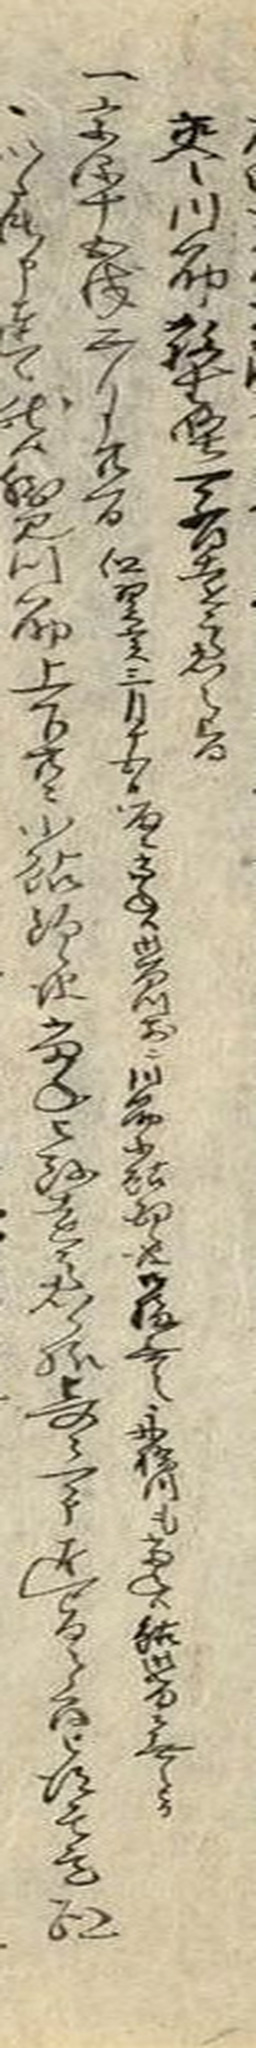・以手紙申達候然ハ勝見川筋上下共ニ小鮎釣候儀当年被致遠慮候様寄々可申達旨ニ候間被得其意組
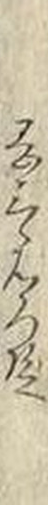土屋十郎右衛門殿
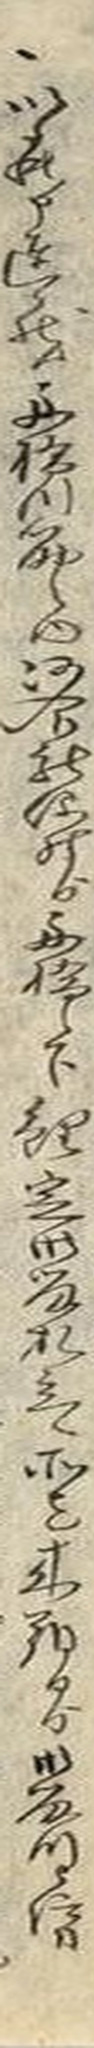・以手紙申達候然ハ舟橋川筋之内河合新保村ゟ船橋之下鯉定御留札立候所迄来朔日ゟ御留川被仰付
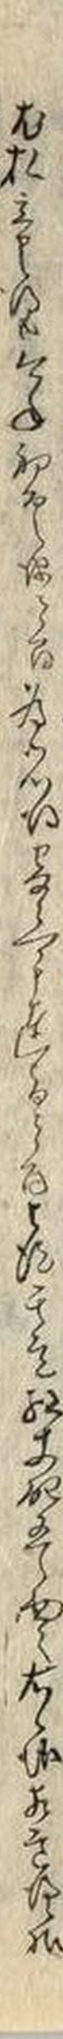尤札立申候得共今年初而之儀ニ候間為御心得寄々可申達旨ニ候間被得其意組支配有之面々右之趣相意得候様
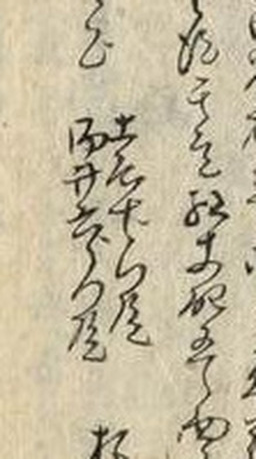土屋十郎右衛門殿
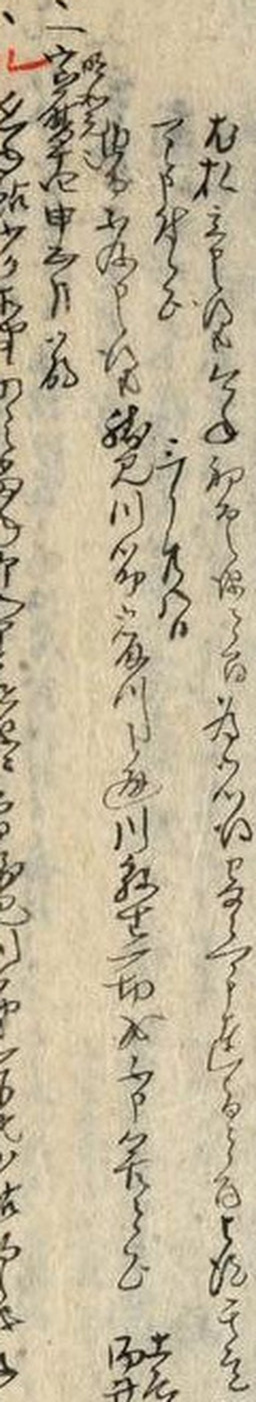不及申候得共勝見川筋御留川之通川殺生一切成不申筈ニ候以上
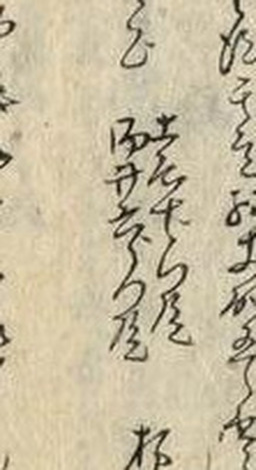土屋十郎右衛門殿
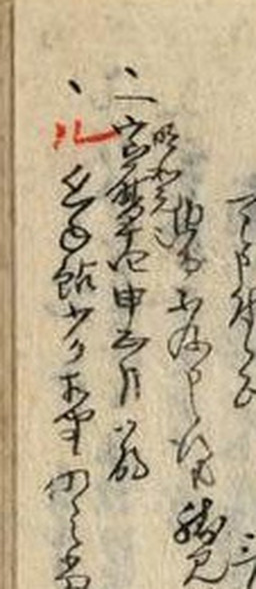一宝暦十四申正月御触
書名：御国他国諸事之部
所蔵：福井県文書館 Fukui Prefectural Archives
